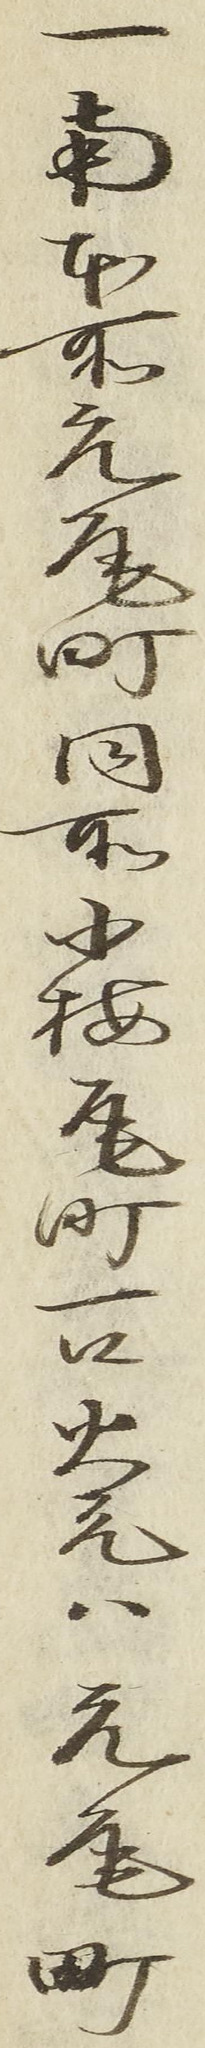一南本所元瓦町同所小梅瓦町一口火元は元瓦町

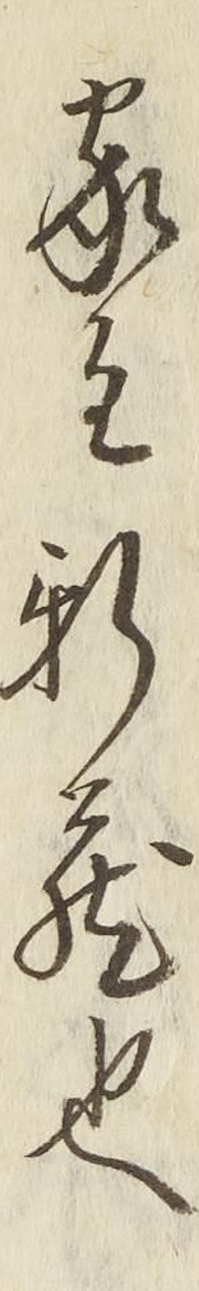家主新蔵也
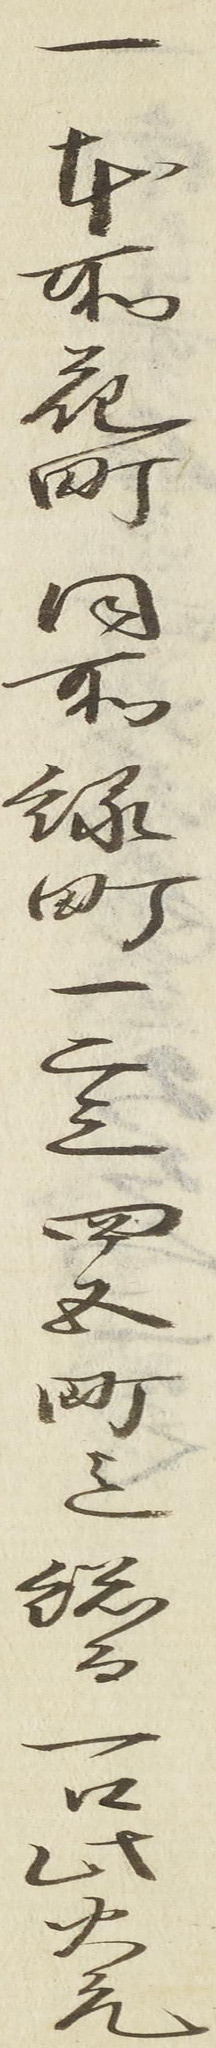一本所花町同所緑町一二三四五町迄総て一口此火元
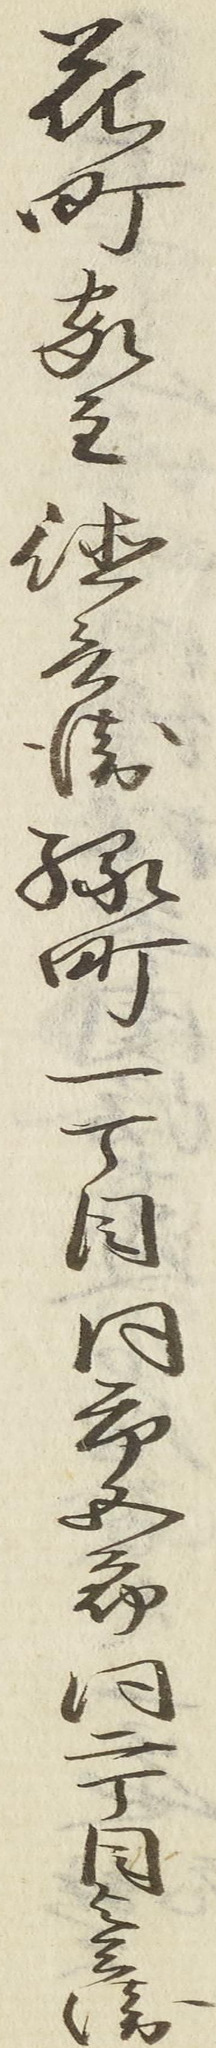花町家主徳兵衛緑町一丁目同市五郎同二丁目与兵衛
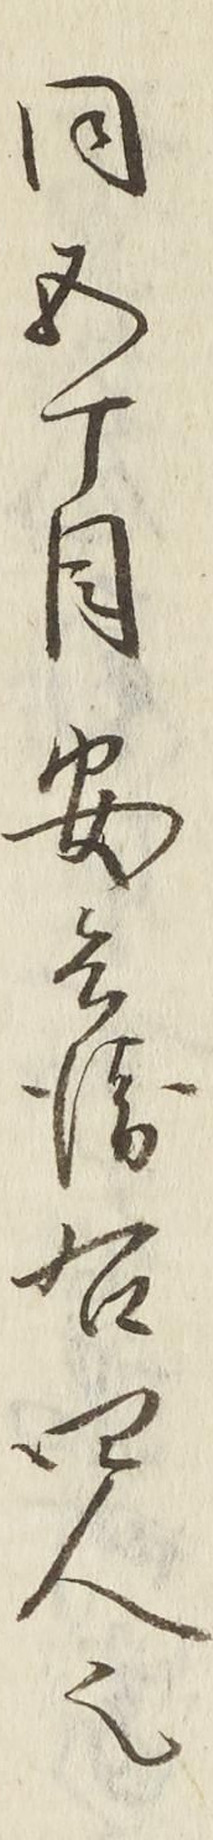同五丁目安兵衛右四人也
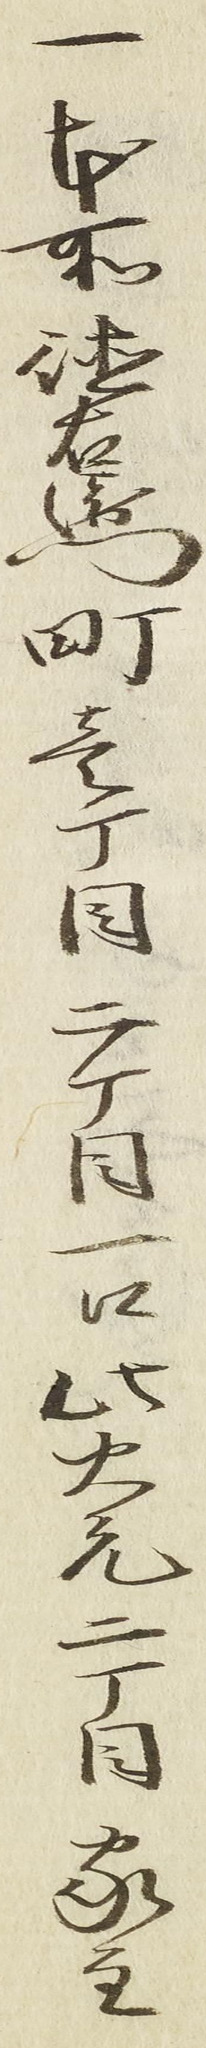一本所徳右衛門町壱丁目二丁目一口此火元二丁目家主
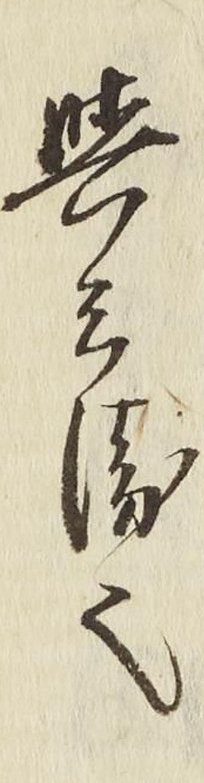與兵衛也
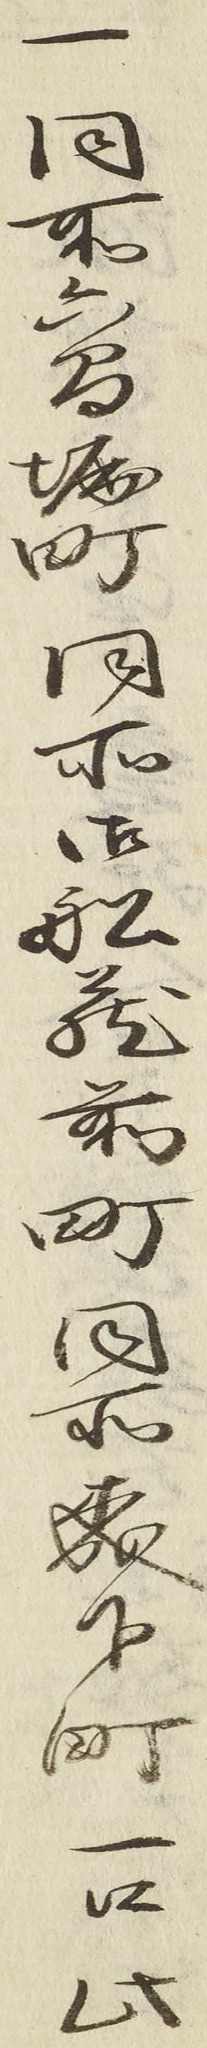一同所六間堀町同所御船蔵前町同所森下町一口此
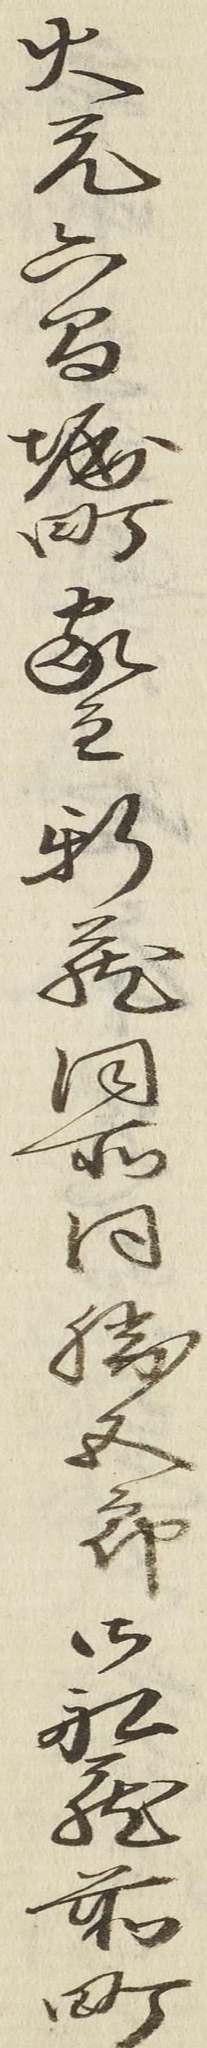火元六間堀町家主新蔵同所同勝五郎御船蔵前町
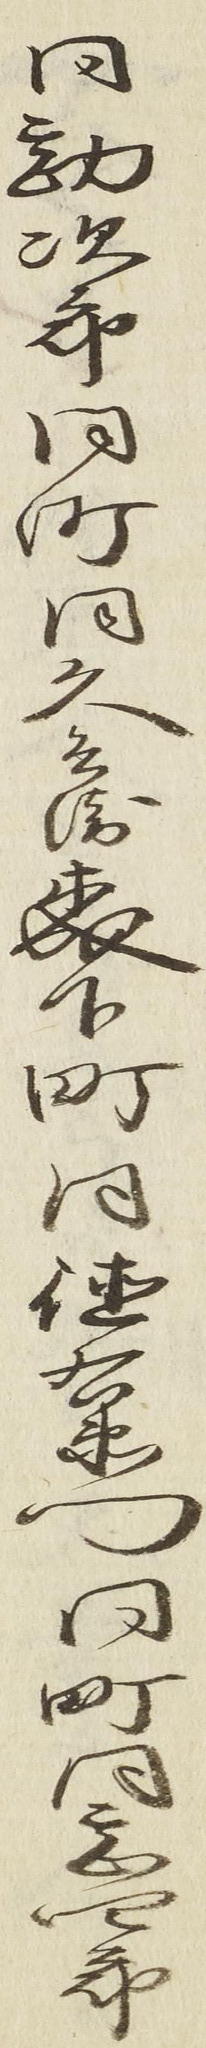同勘次郎同町同久兵衛森下町同徳右衛門同町同甚四郎
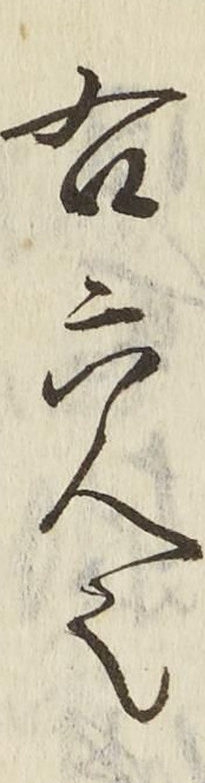右六人也
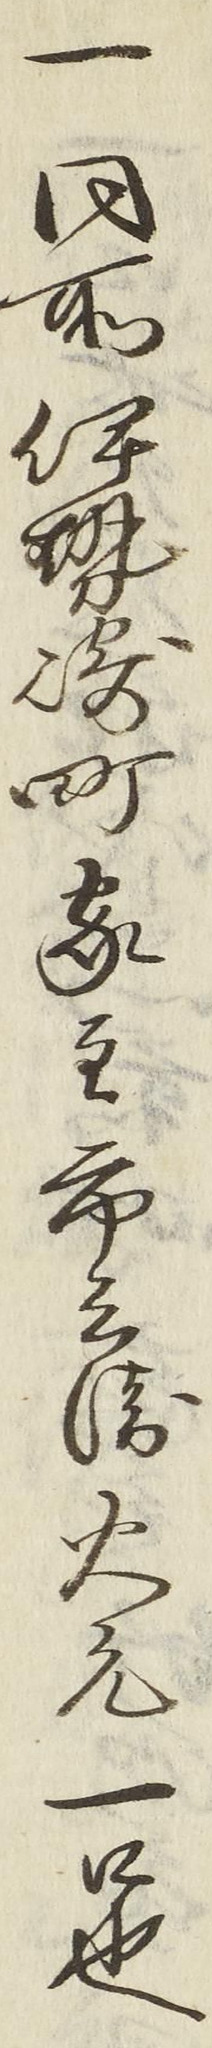一同所伊勢崎町家主市兵衛火元一口也
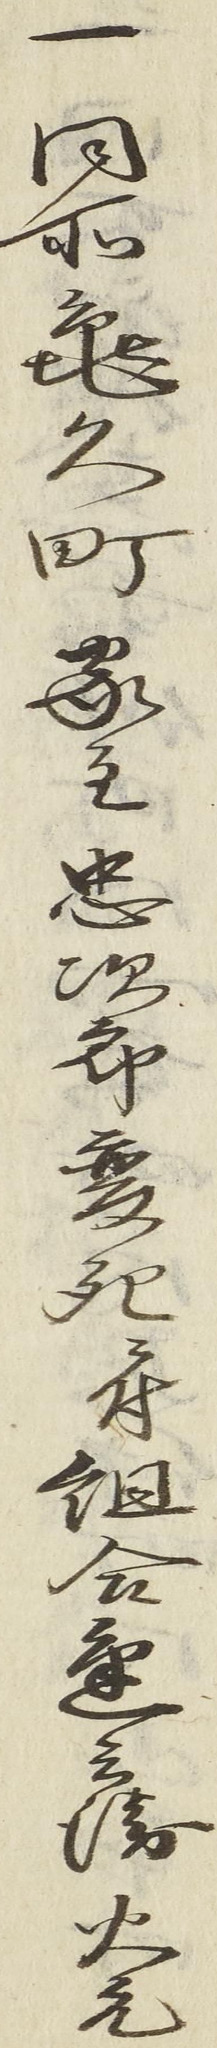一同所亀久町家主忠次郎変死に付組合金兵衛火元
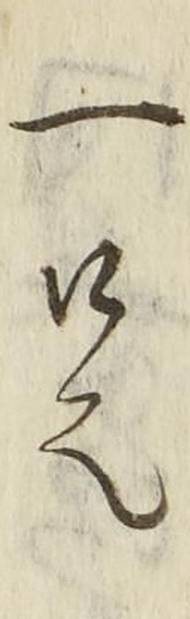一口也
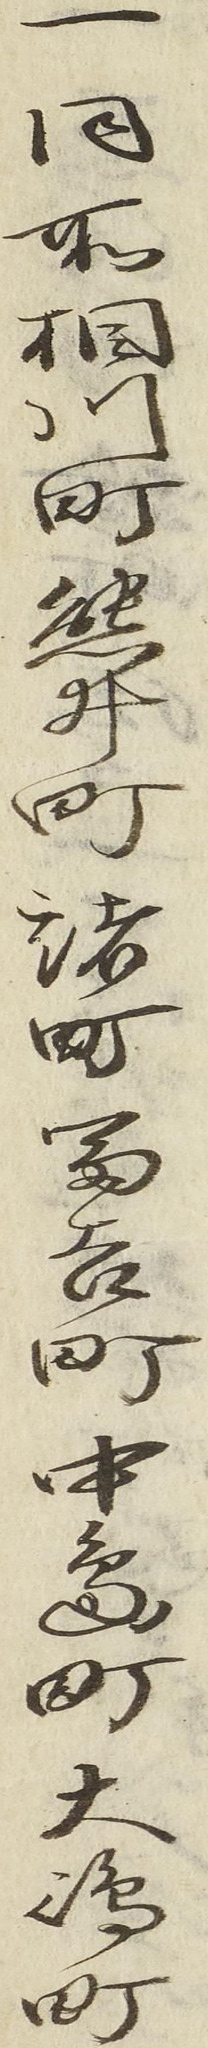一同所相川町熊井町諸町富吉町中島町大島町

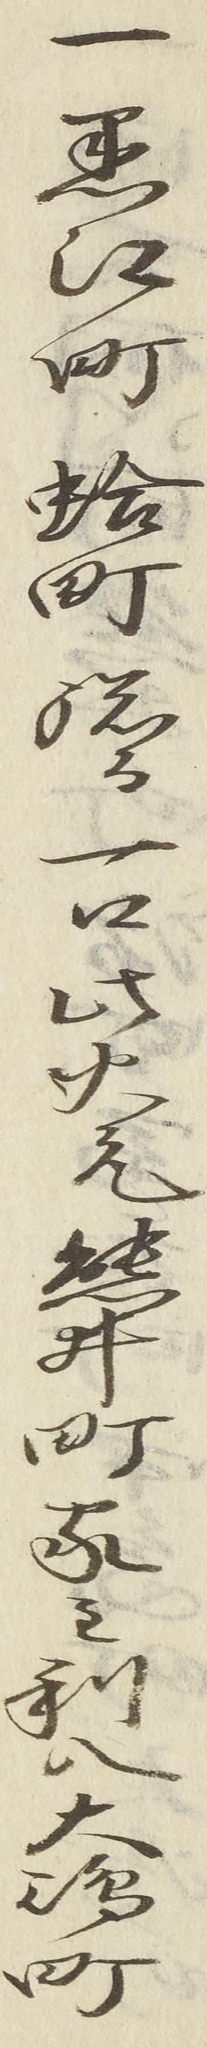一黒江町蛤町総て一口此火元熊井町家主利八大島町
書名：やぶれ窓の記　全
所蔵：東京大学地震研究所図書室 Earthquake Research Institute Library, The University of Tokyo, JAPAN
